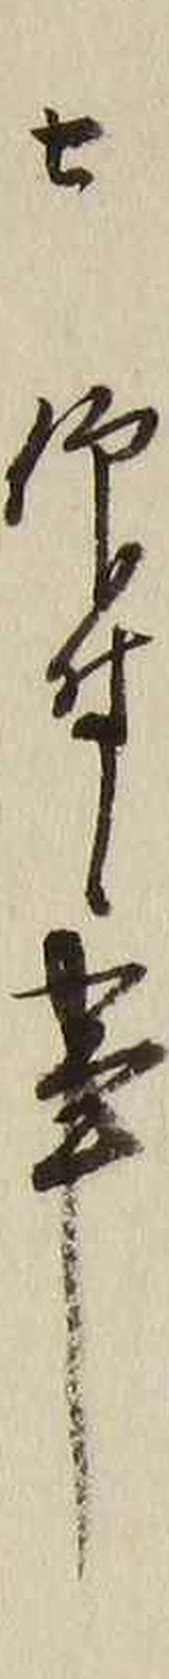被仰付候事
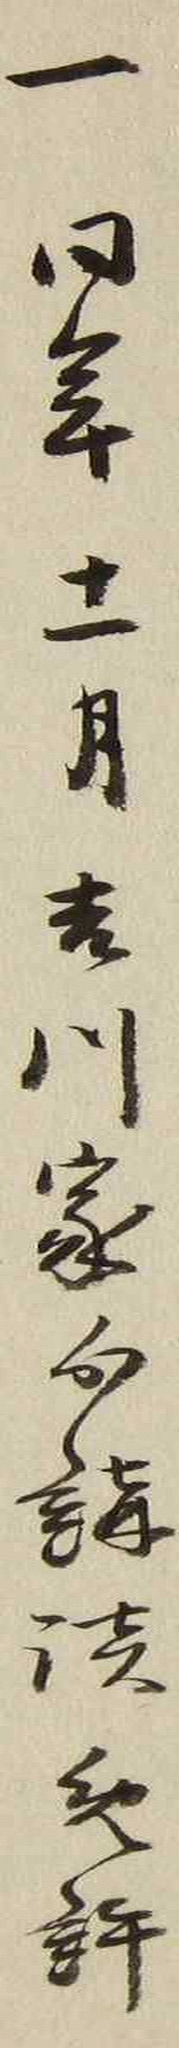一同年十一月吉川家ゟ講談免許
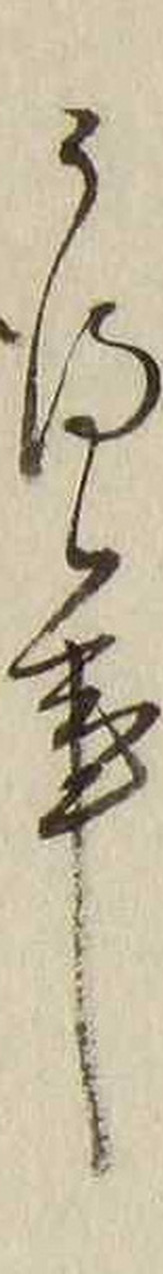を得候事
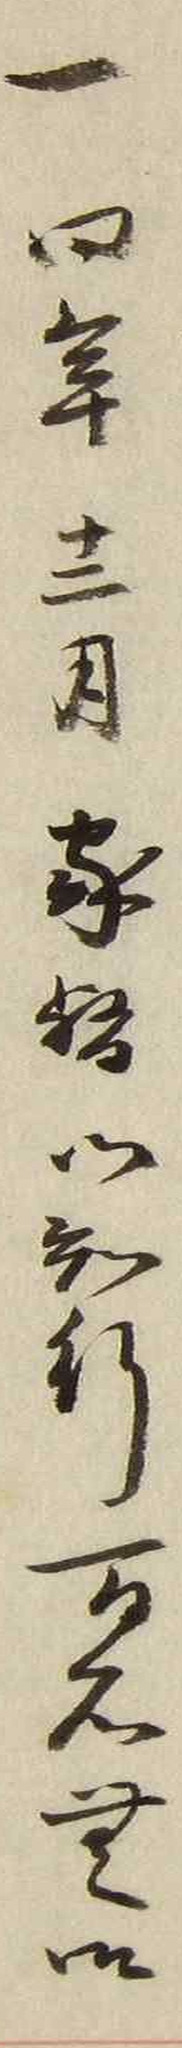一同年十二月家督御知行百石無御

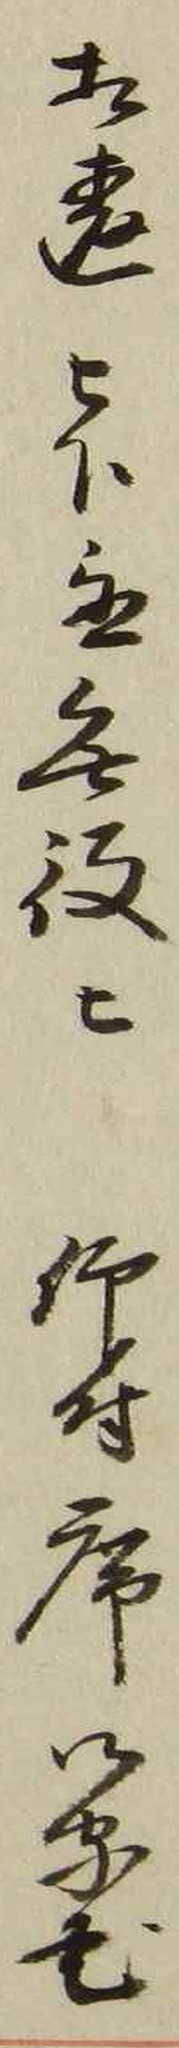相違被下置無役被仰付席御家老
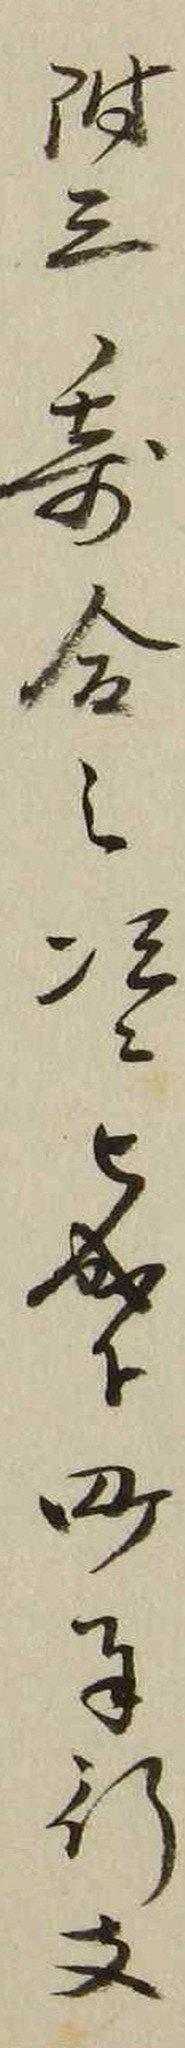附三ノ寄合之次ニ被成下町奉行支
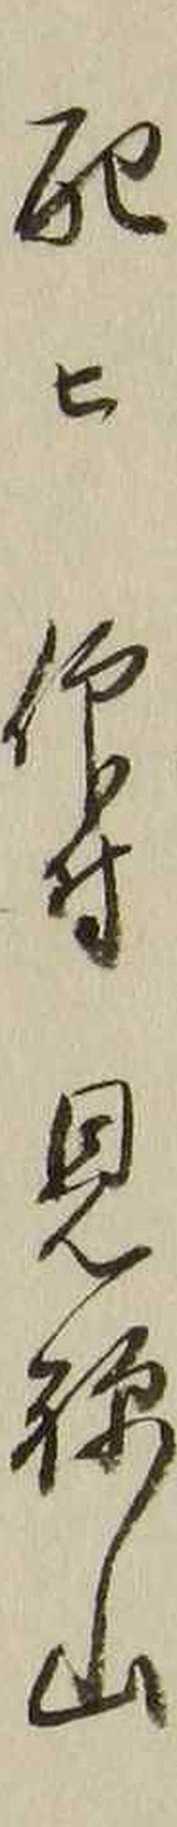配被仰付見祢山
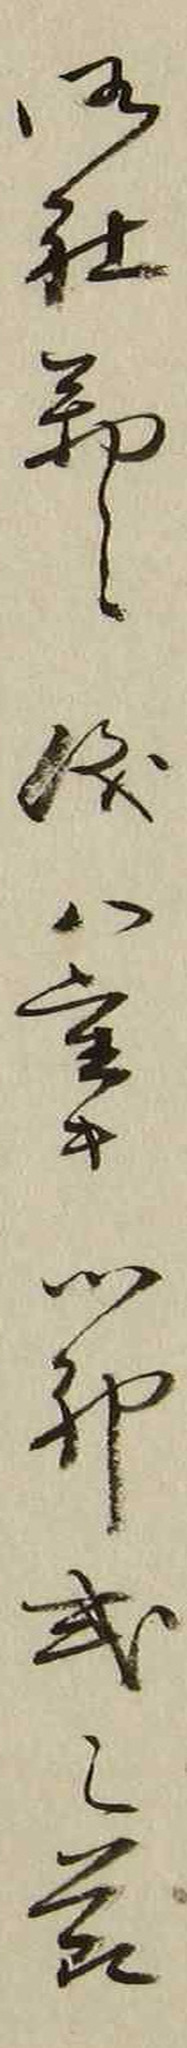御社勤之儀ハ重キ御神式之節
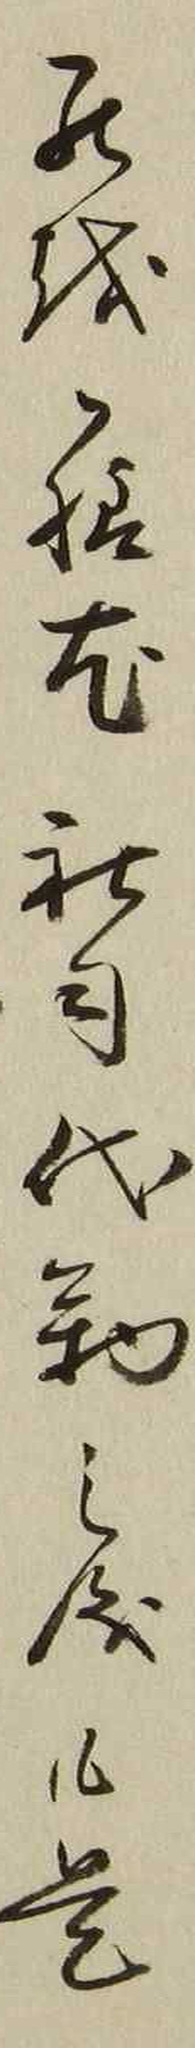罷越候様尤社司代勤之儀も是
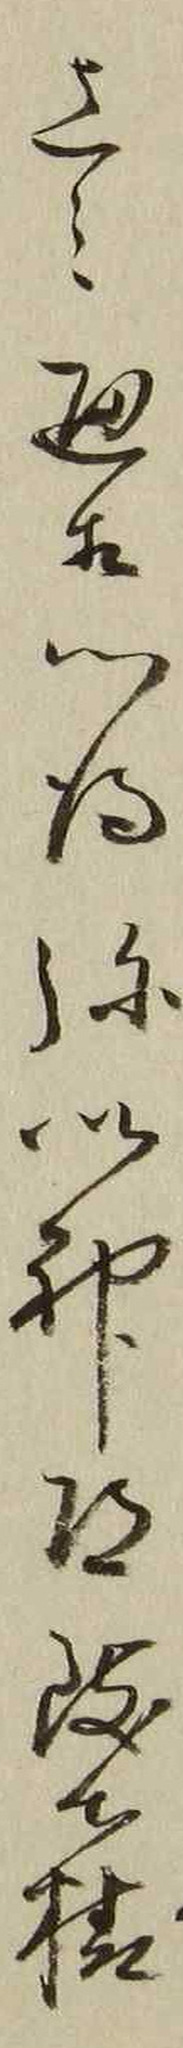迄之通相心得弥以神道致出精
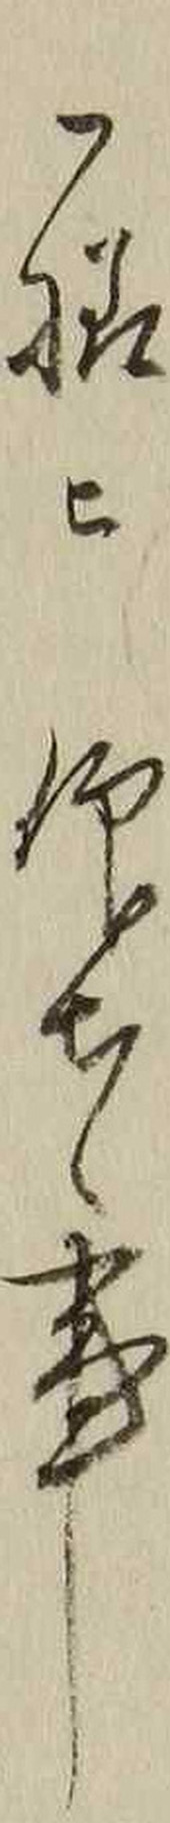候様被仰出候事
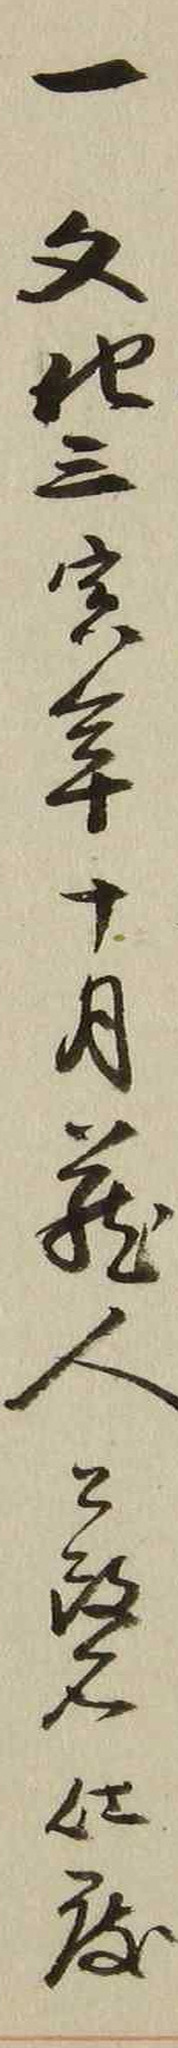一文化三寅年十月蔵人と改名仕度
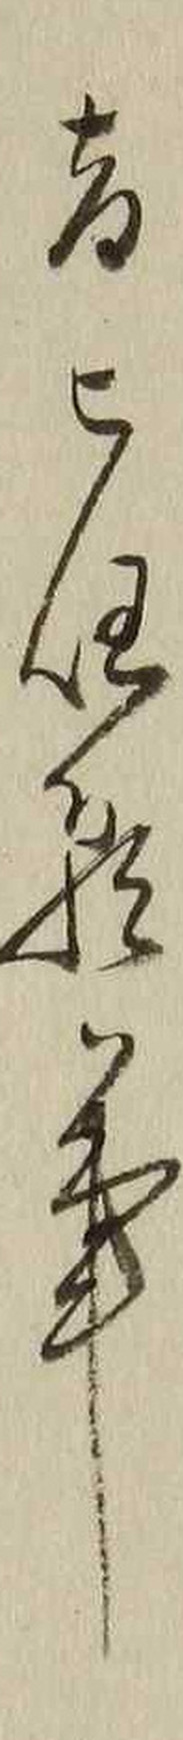旨被任願候事
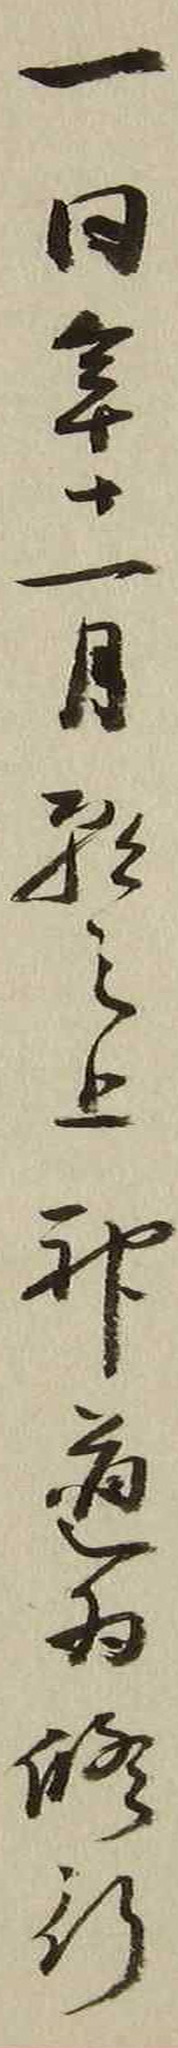一同年十一月願之上神道為修行
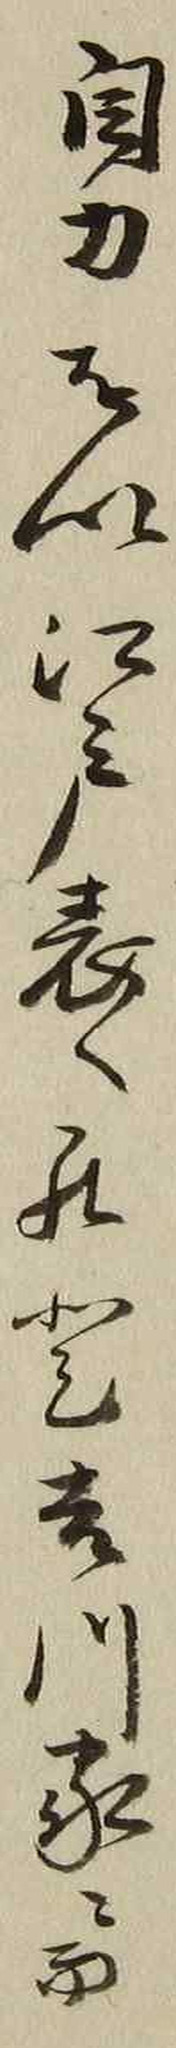自力を以江戸表へ罷登吉川家ニ而
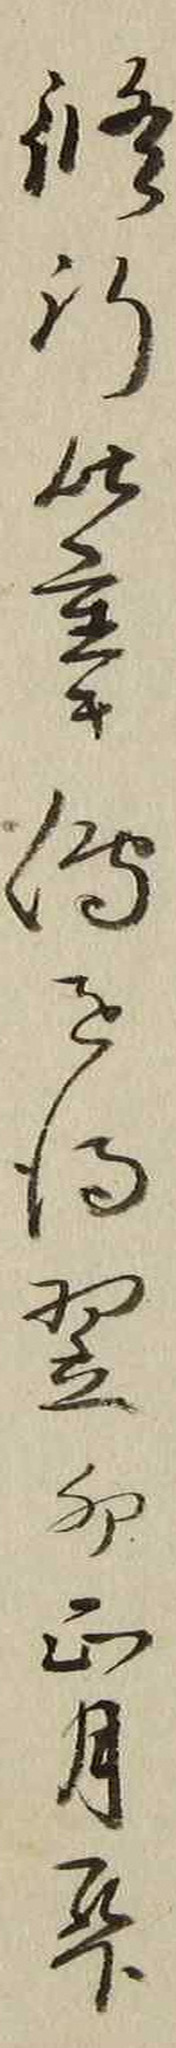修行仕重キ伝を得翌卯正月罷下
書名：諸士系譜　巻之291　さ之部23
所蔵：会津若松市立会津図書館
